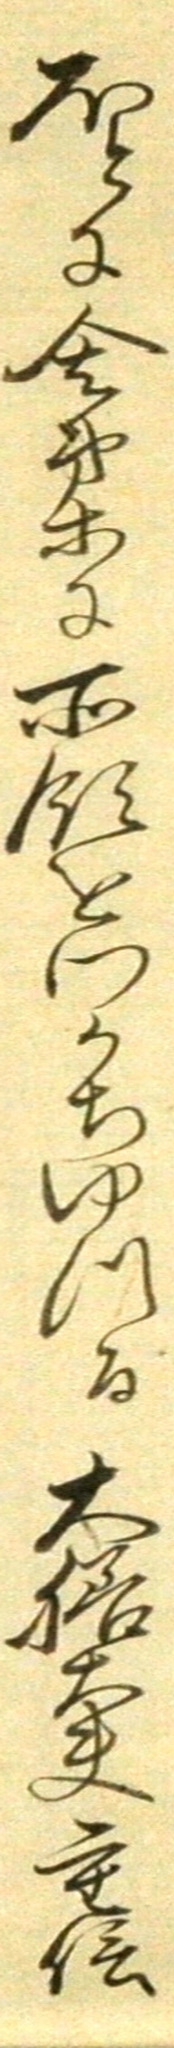ほとに舎弟等に所領をわかちゆつる大膳大夫重信
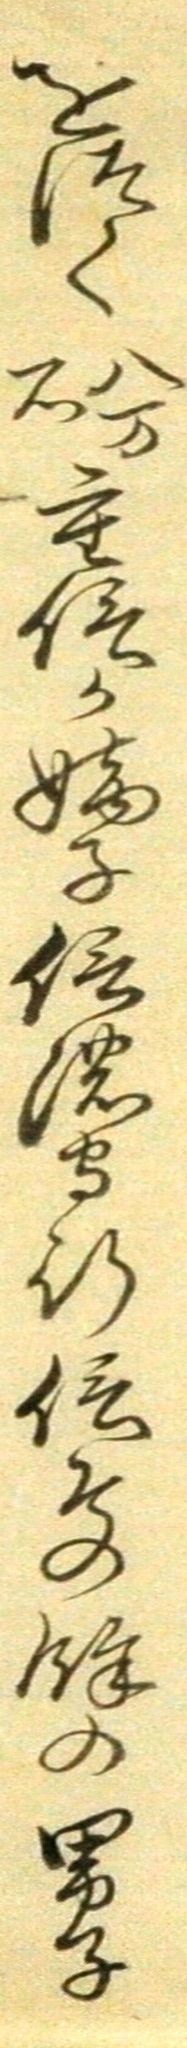をつく八万石重信か嫡子信濃守行信その余の男子
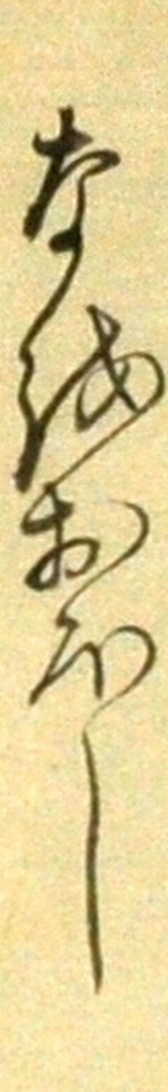なをおほし
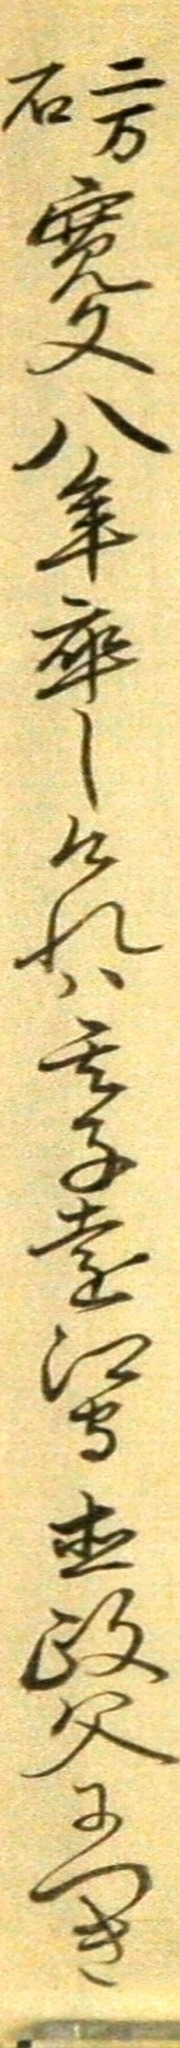二万石寛文八年卒しけれは其子遠江守直政父につき

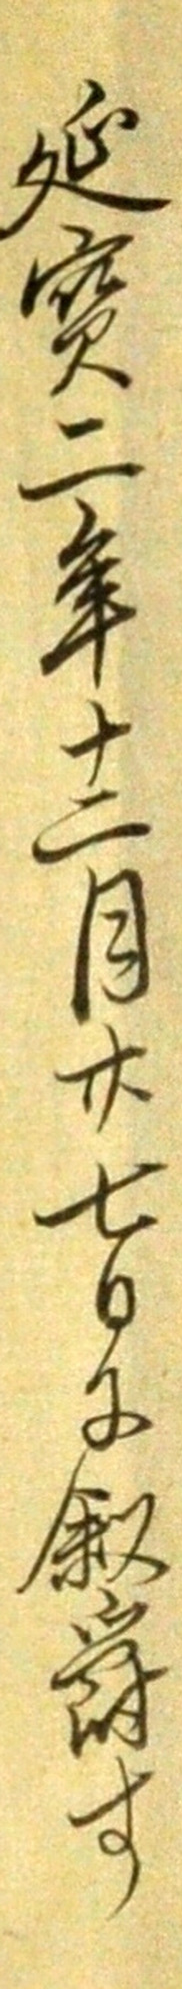延宝二年十二月廿七日に叙爵す
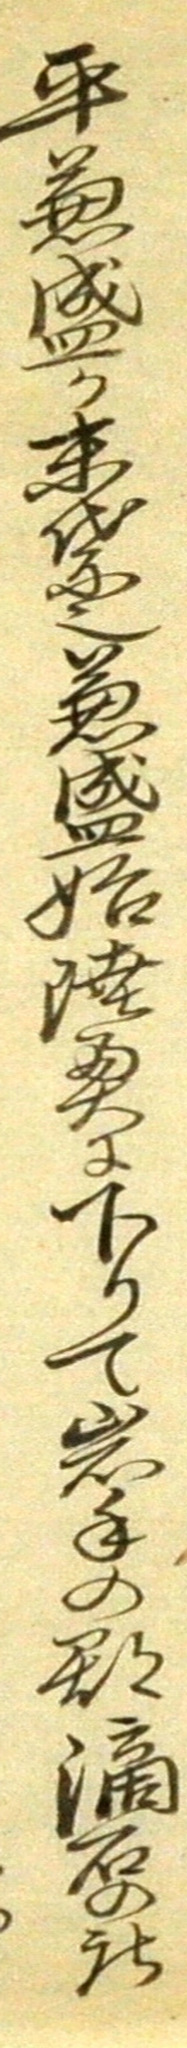平兼盛か末葉也兼盛始陸奥に下りて岩手の郡滴石の庄

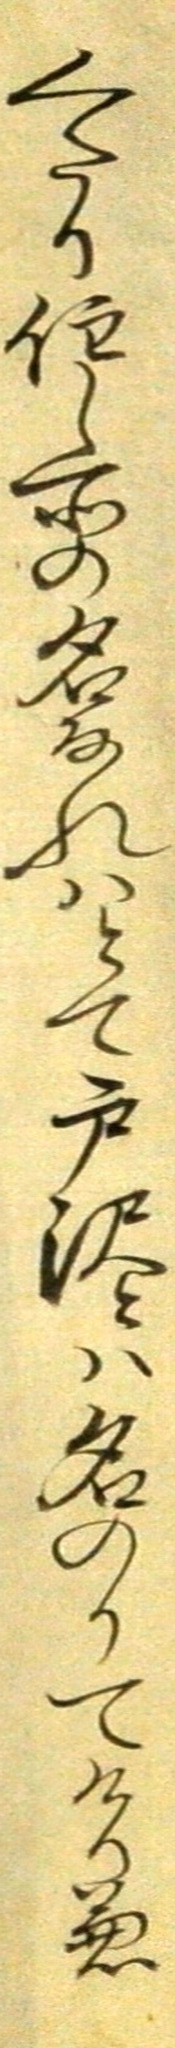くたり住し所の名なれはとて戸沢とは名のりてけり兼
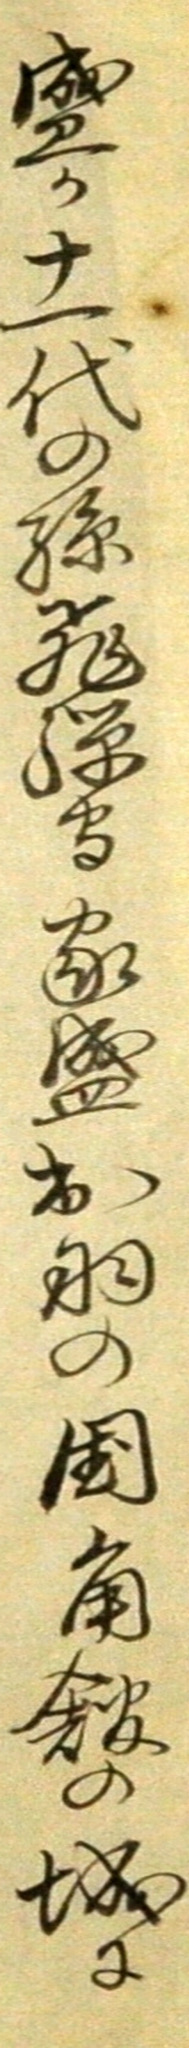盛か十一代の孫飛騨守家盛出羽の国角館の城に
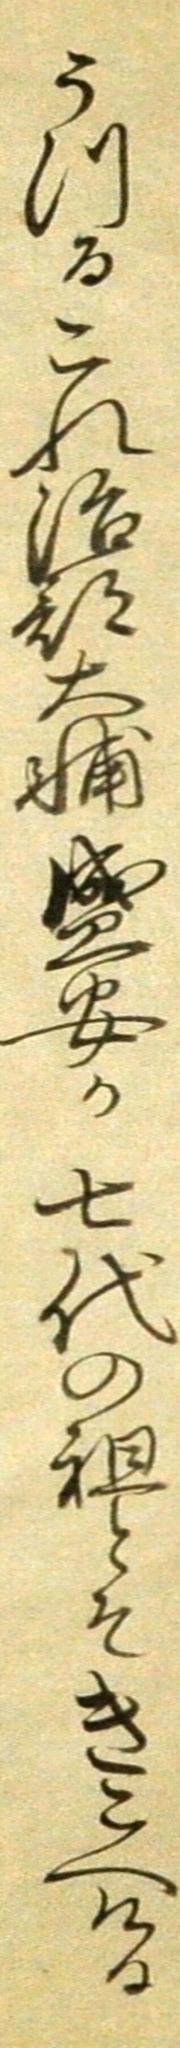うつるこれ治部大輔盛安か七代の祖とそきこへける
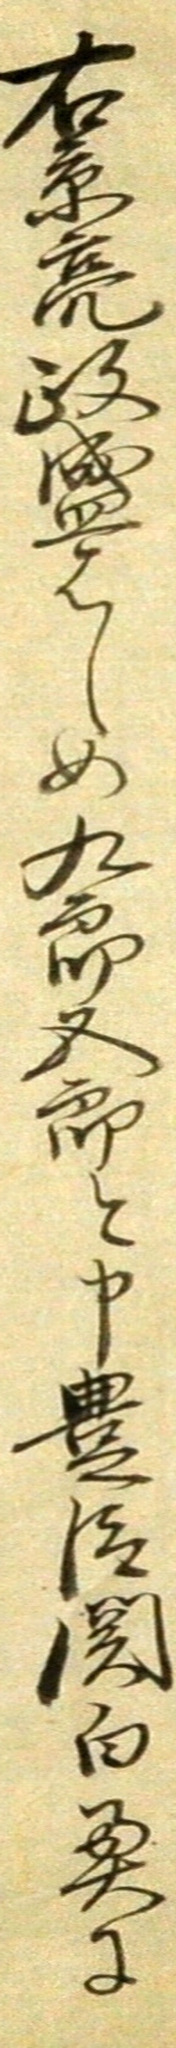右京亮政盛はしめ九郎五郎と申豊臣関白奥に
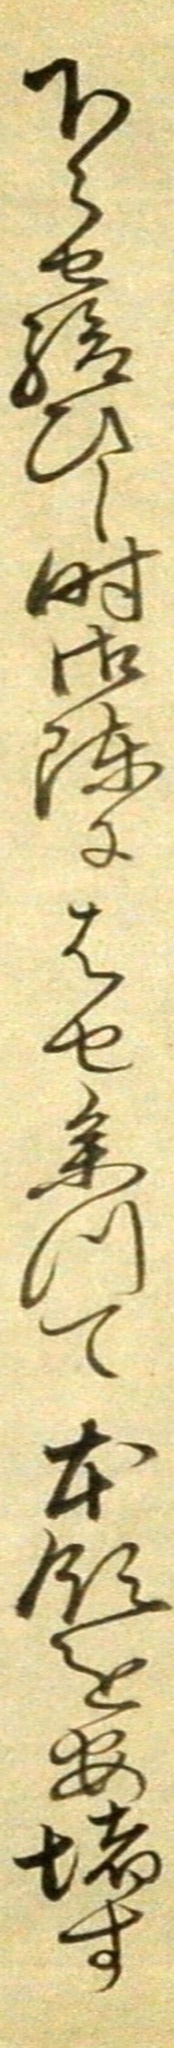下らせ給ひし時御陣にはせ参つて本領を安堵す
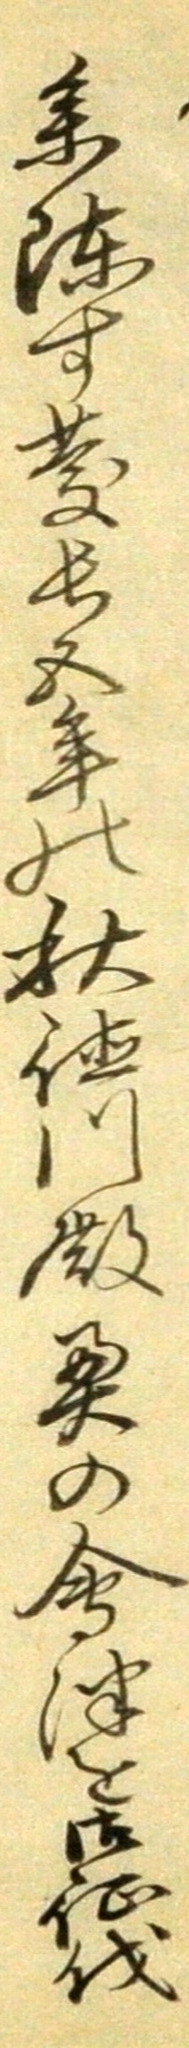参陣す慶長五年の秋徳川殿奥の会津を御征伐
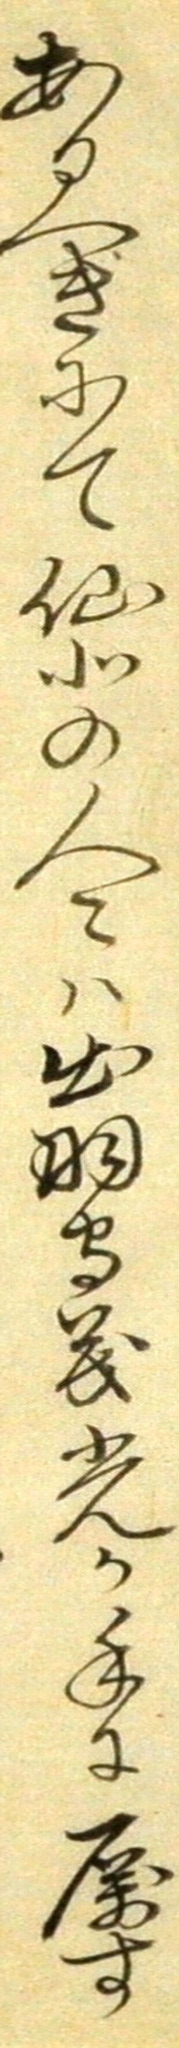あるへきにて仙北の人々は出羽守義光か手に属す
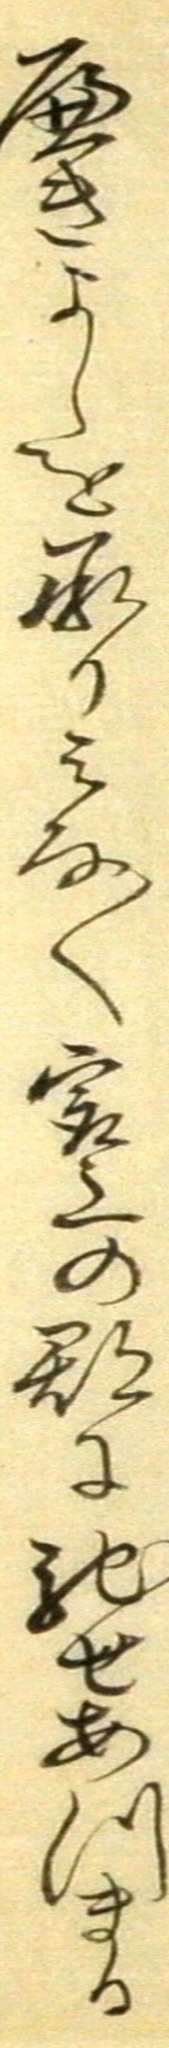へきよしを承りみな〳〵最上の郡に馳せあつまる
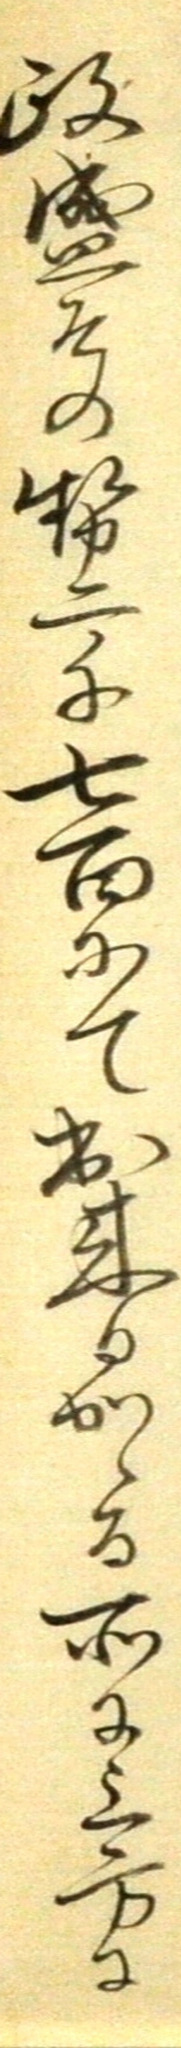政盛その勢二千七百にて出来るかゝる所に上方に
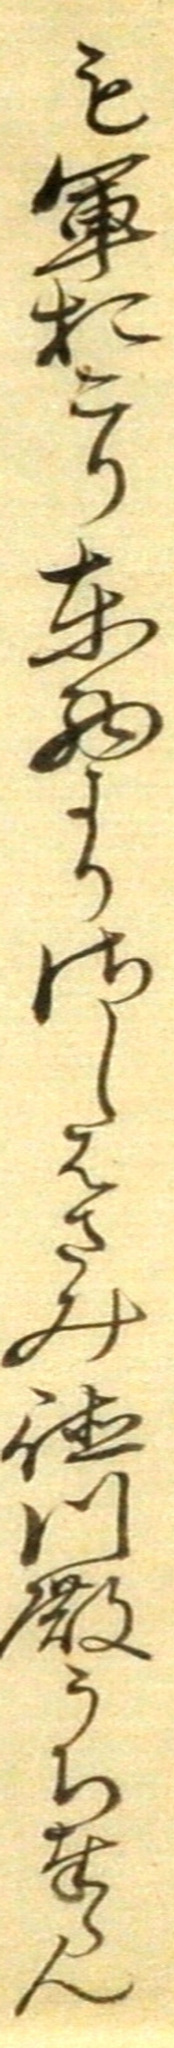も軍おこり東西よりさしはさみ徳川殿うち奉らん
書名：藩翰譜（九・下）
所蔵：伊那市立高遠町図書館・合同会社AMANE
